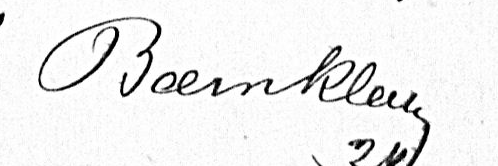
Bxx
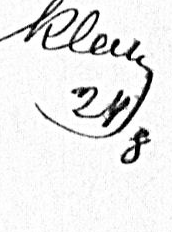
24/8
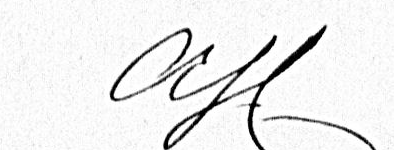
Ah.E
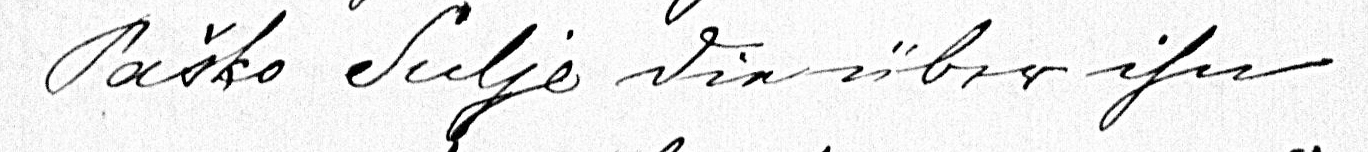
Paško Šulje die über ihn
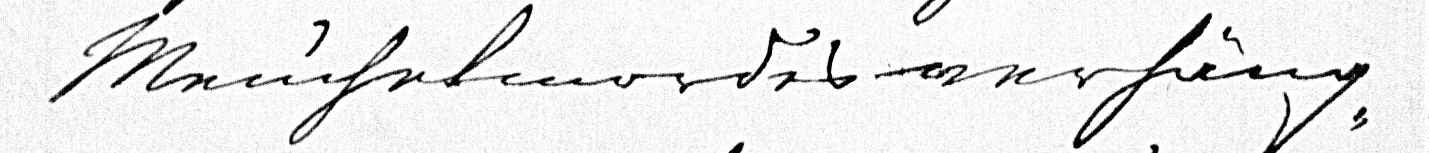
Meuchelmordes verhäng¬
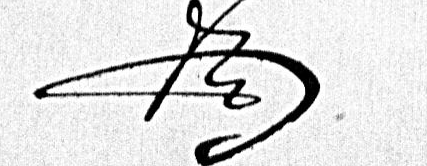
xx
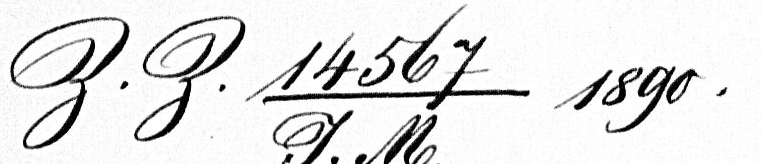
Z.Z. 14567 1890.
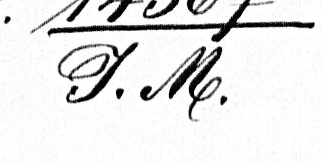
J. M.
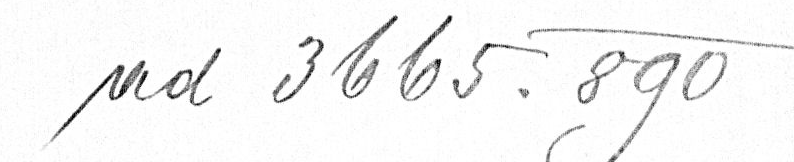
ad 3665. 890
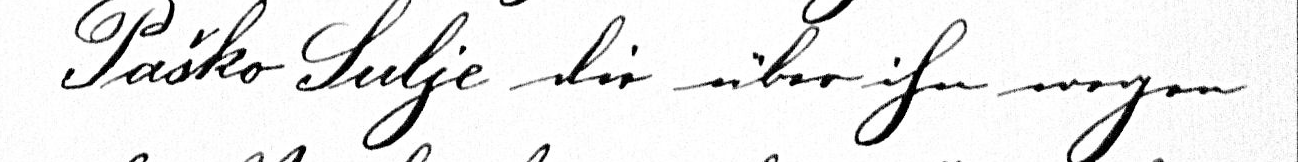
Paško Šulje die über ihn wegen
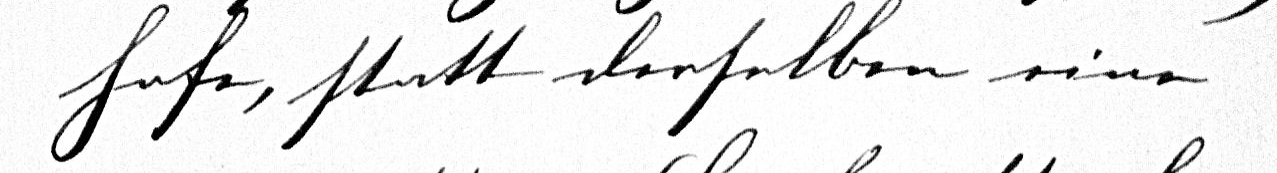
hofe, statt denselben eine
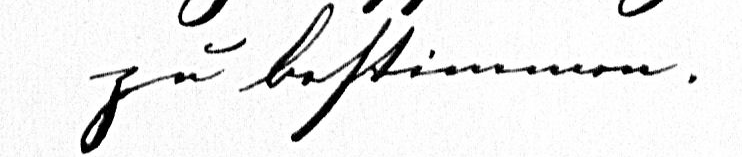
zu bestimmen.
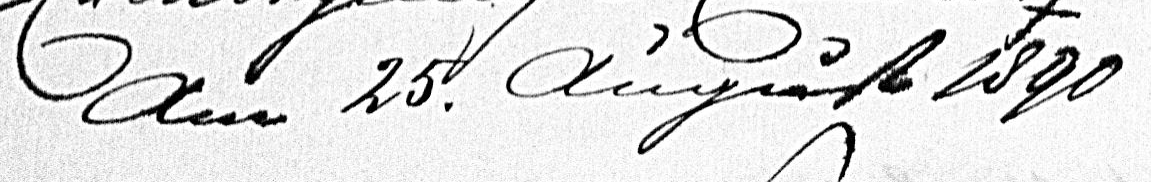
Am 25. August 1890
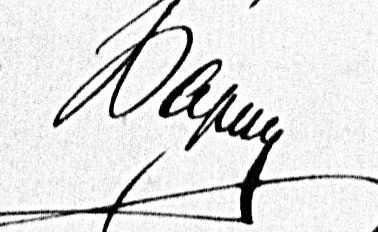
xx
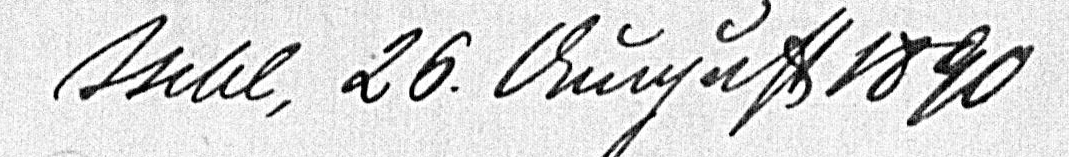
Ischl, 26. August 1890
